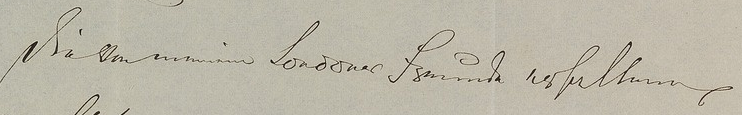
Die von meinem Londoner Freunde erhaltene
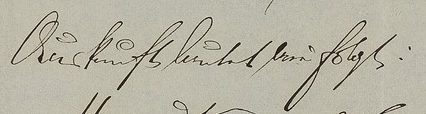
Auskunft lautet wie folgt:
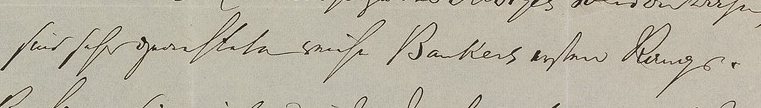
sind sehr geachtete reiche Bankers ersten Rangs.
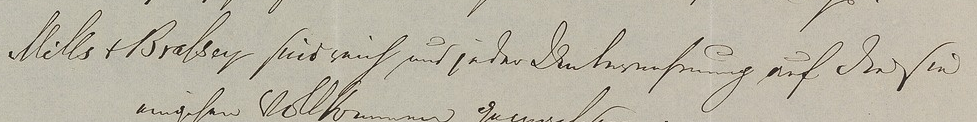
Mills + Brassey sind reich und jeder Unternehmung auf die sie
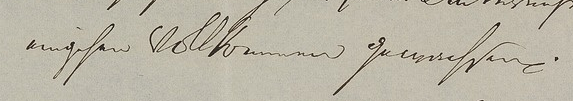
eingehen vollkommen gewachsen.
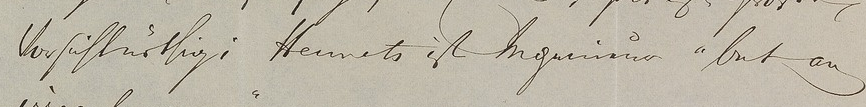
Vorsicht nöthig; Hennets ist Ingenieur «but an
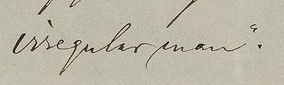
irregular man».
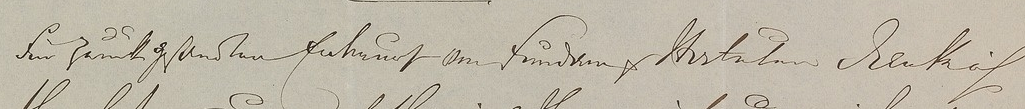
Für zurückgesandten Entwurf von Fundam & Statuten danke ich
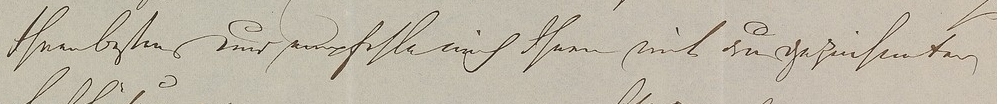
Ihnen bestens und empfehle mich Ihnen mit ausgezeichneter
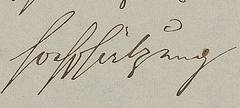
Hochschätzung
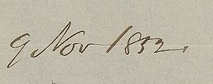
9 Nov 1852.
